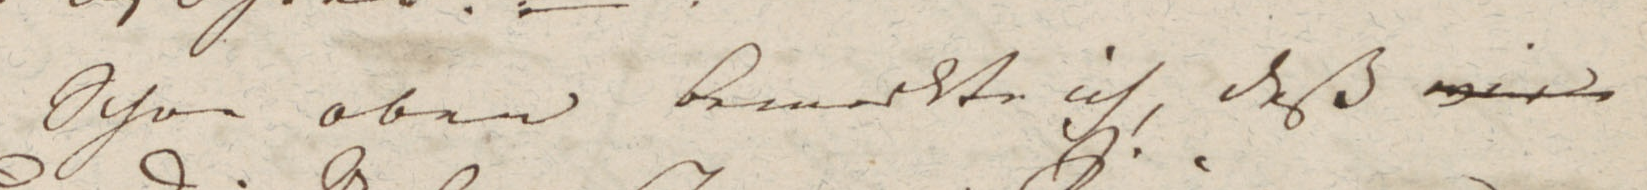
Schon oben bemerkte ich, dass wir
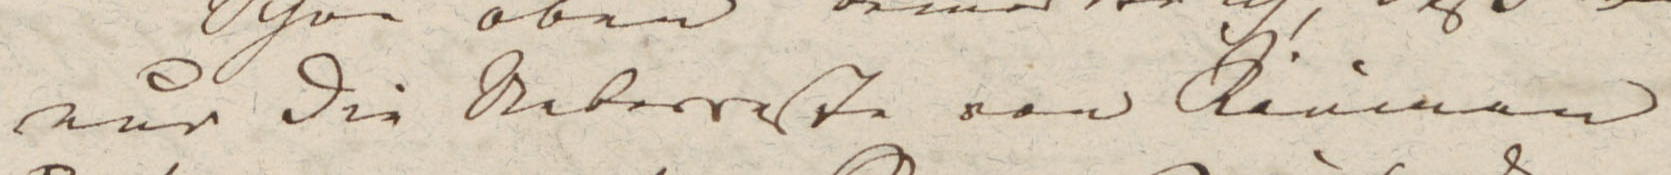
nur die Ueberreste von Räumen
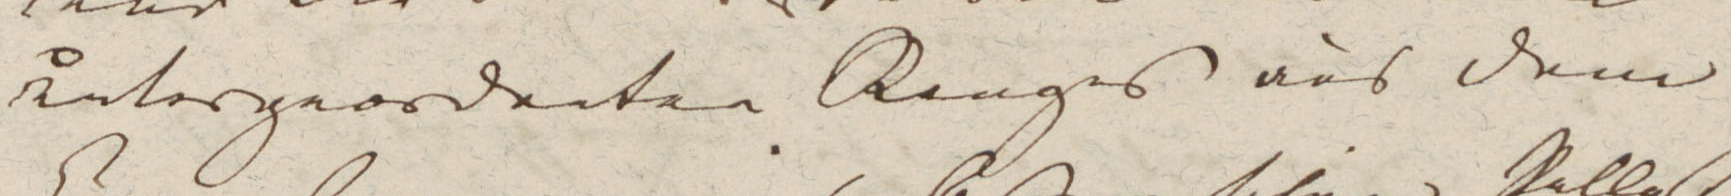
untergeordneten Ranges aus dem
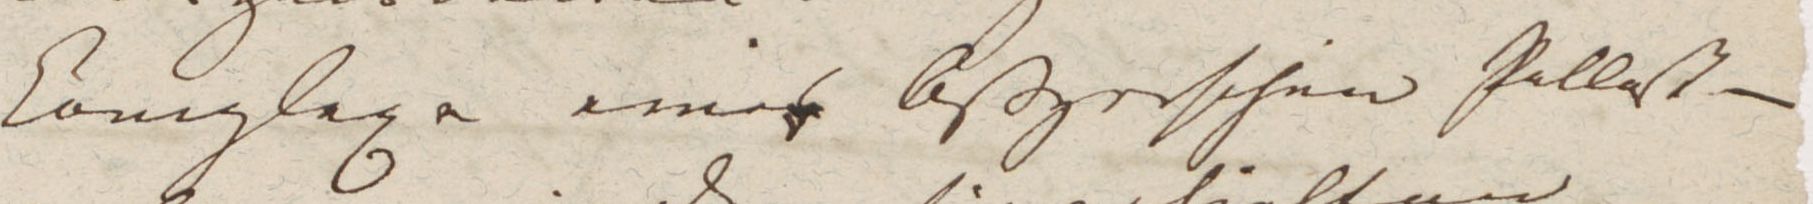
Complexe einesr Assyrischen Pallast-
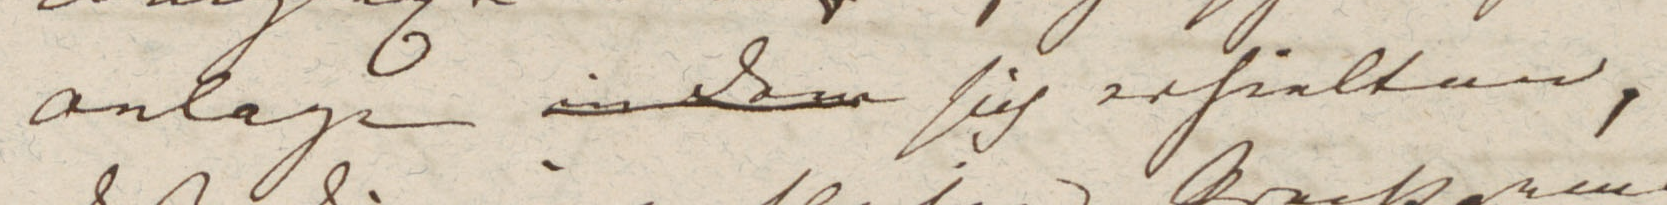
anlage in dem sich erhielten,
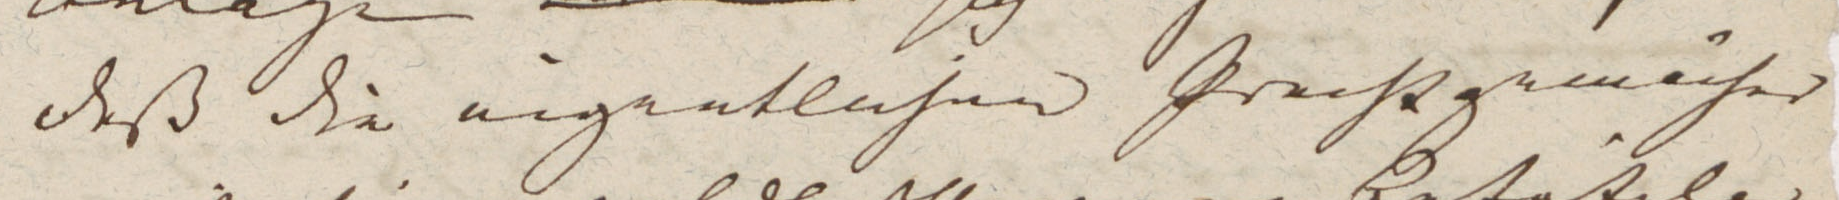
dass die eigentlichen Prachtgemächer
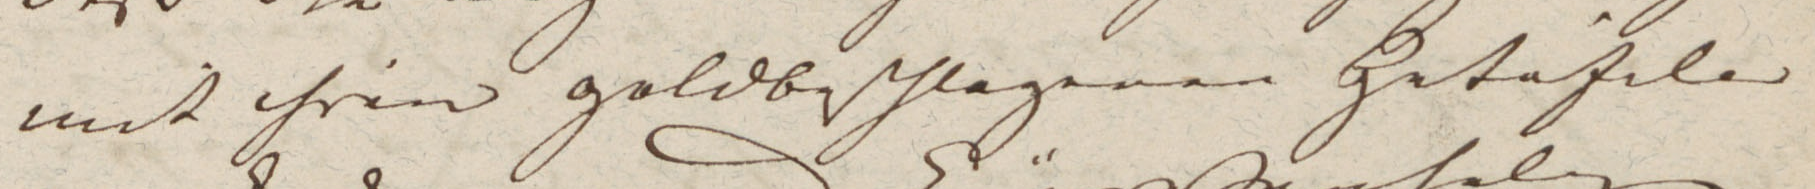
mit ihren goldbeschlagenen Getäfeln
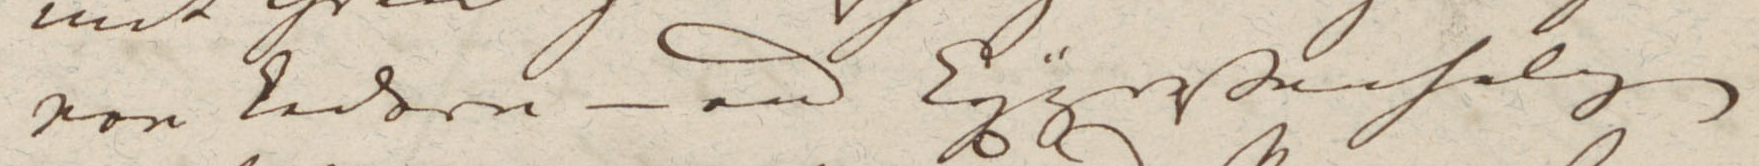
von Cedern- und Cypressenholz
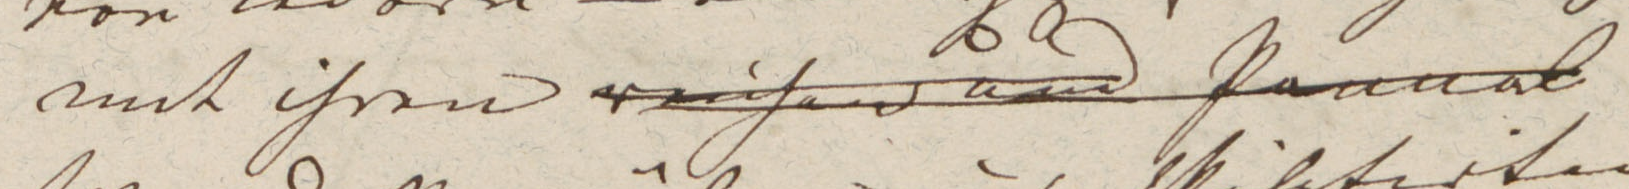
mit ihren reichen und Pennal
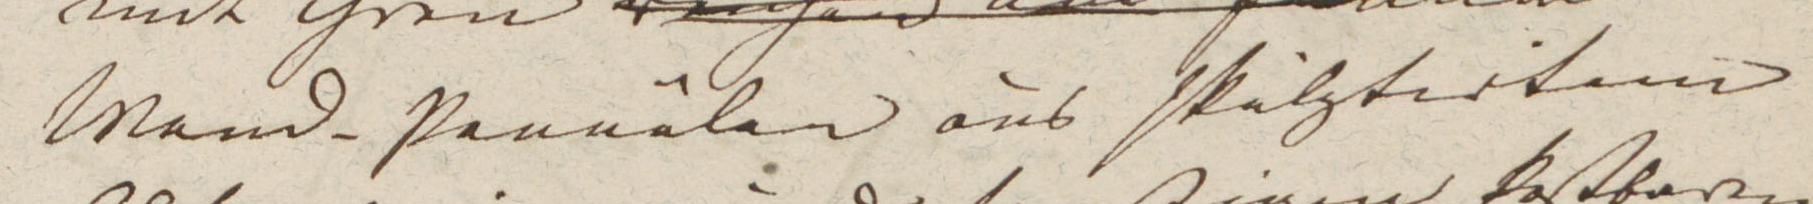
Wand-Pennälen aus skulptirtem
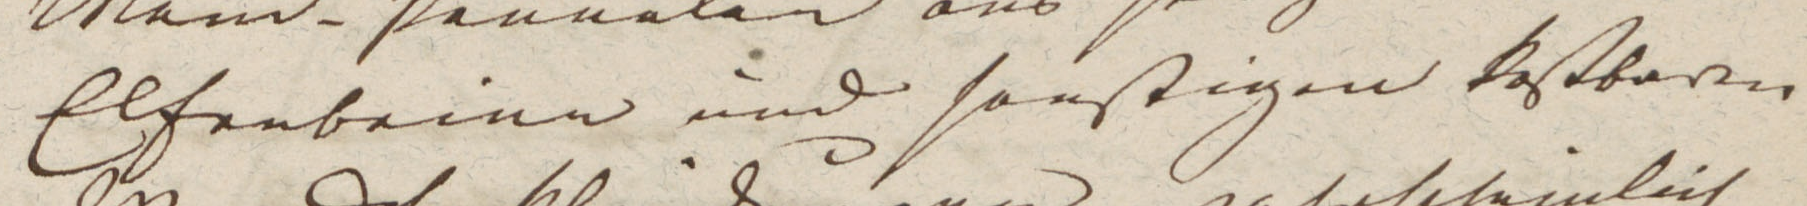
Elfenbeine und sonstigen kostbaren
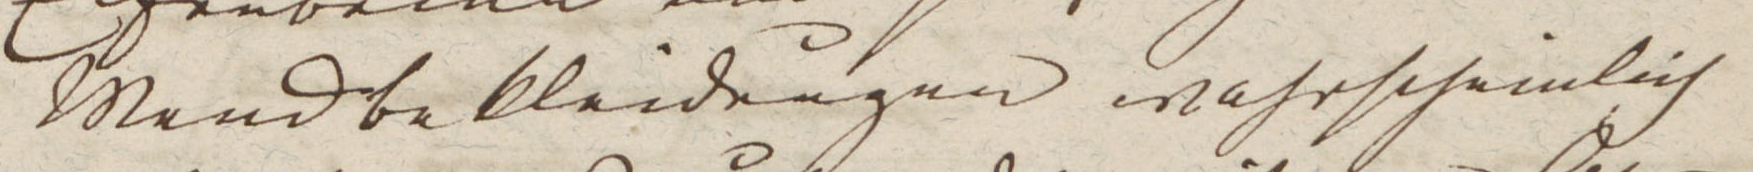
Wandbekleidungen wahrscheinlich
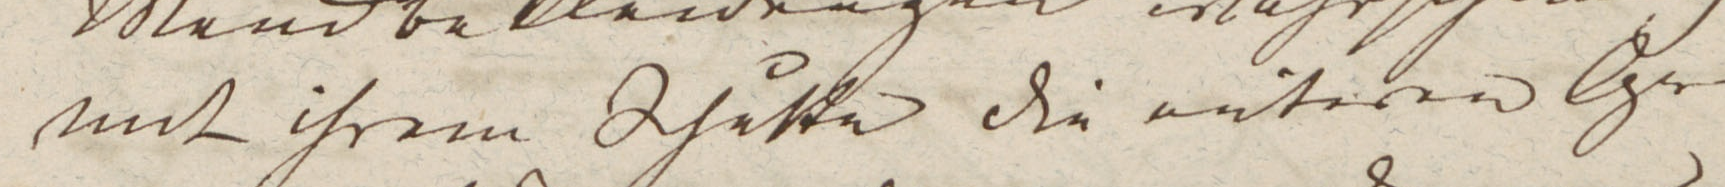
mit ihrem Schutte die unteren Ge-
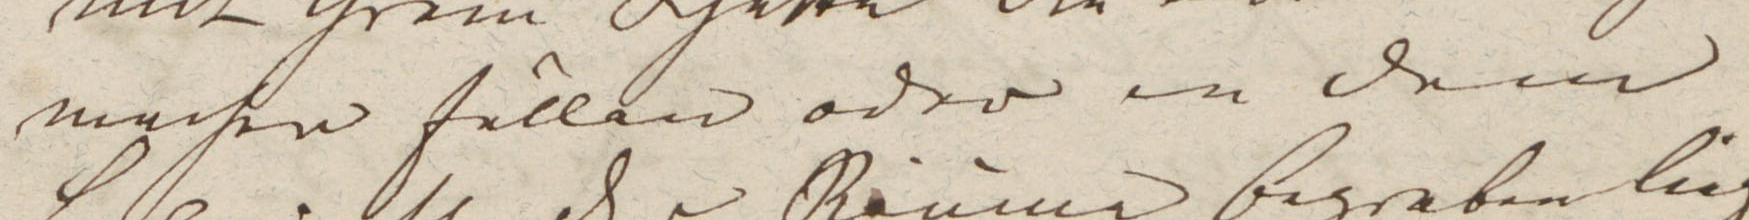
macher füllen oder in dem
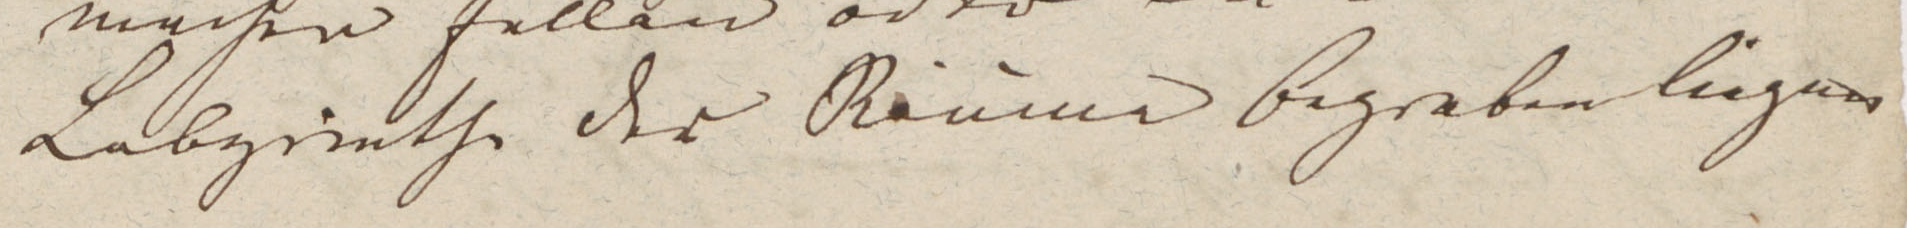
Labyrinth der Räume begraben liegen.
